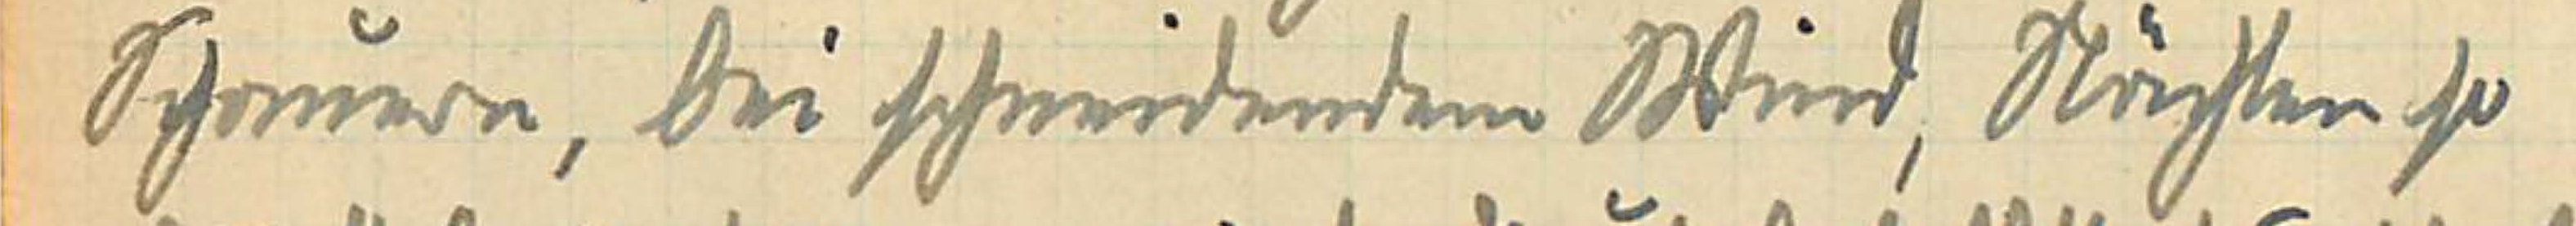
Schauern, bei schneidendem Wind, Nächten so
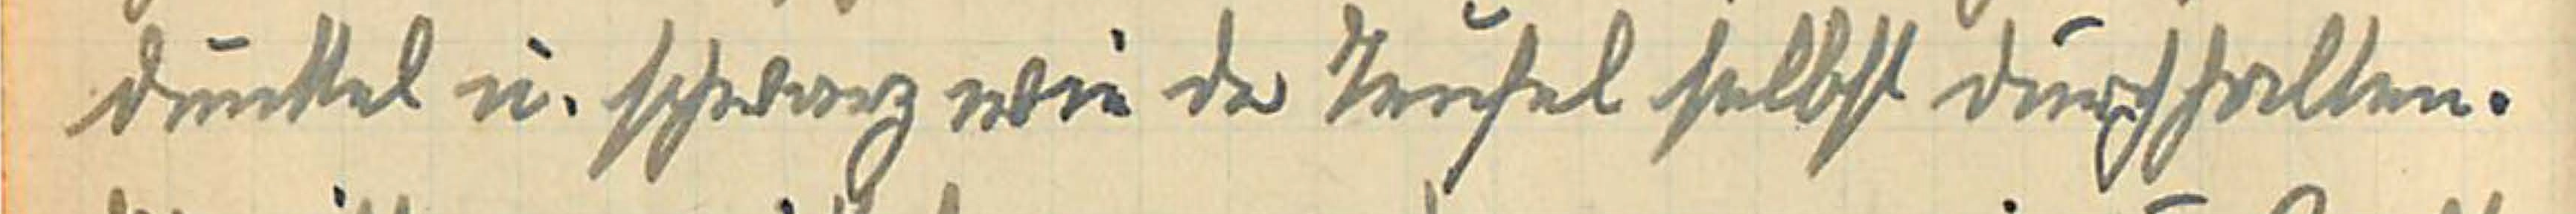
dunkel u. schwarz wie der Teufel selbst durchhalten.
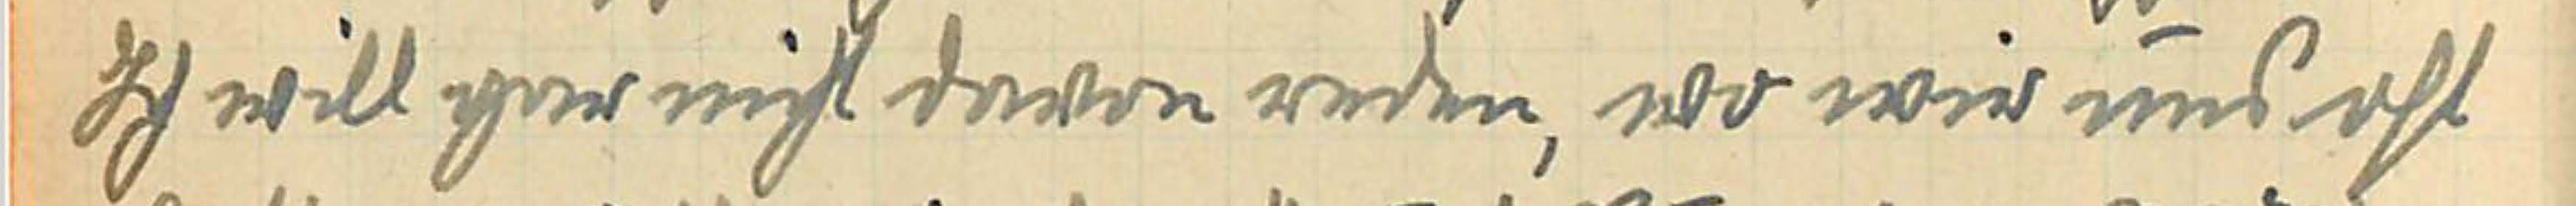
Ich will gar nicht davon reden, wo wir uns oft
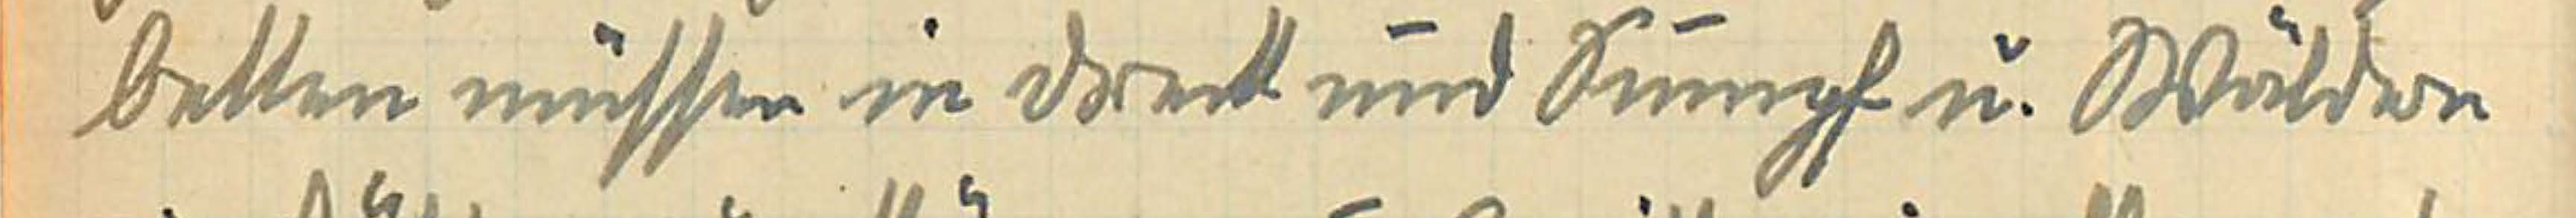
betten müssen in Dreck und Sumpf u. Wäldern
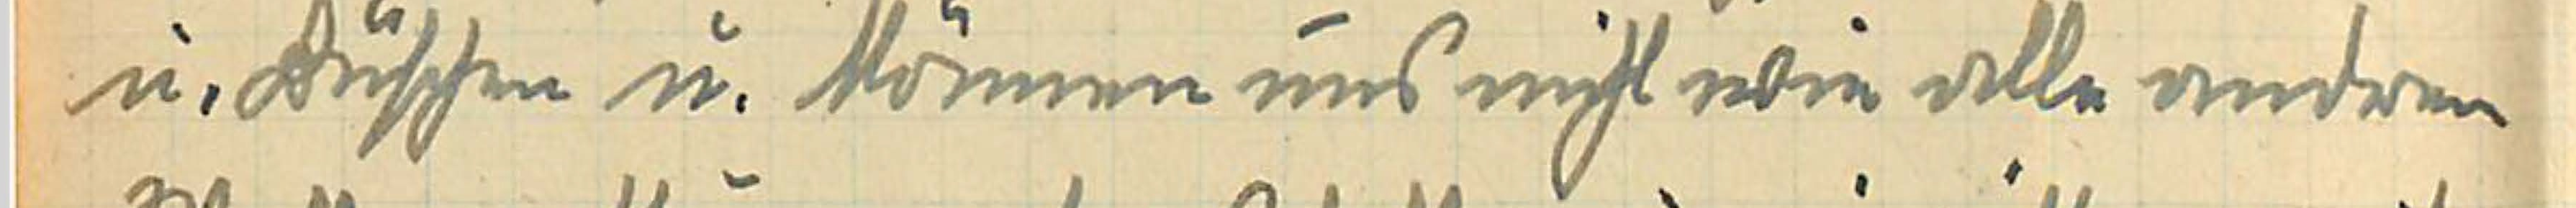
u. Büschen u. können uns nicht wie alle andren
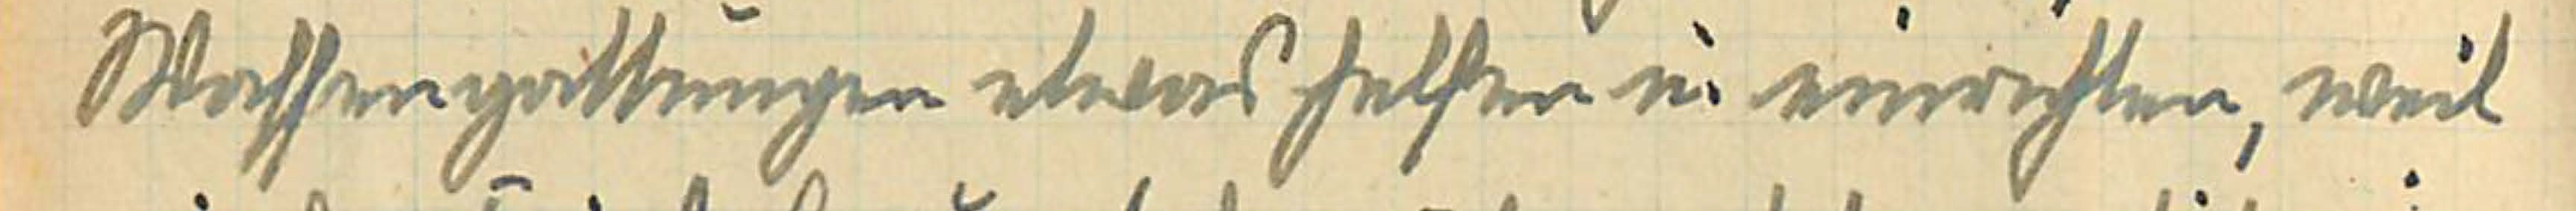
Waffengattungen etwas helfen u. einrichten, weil
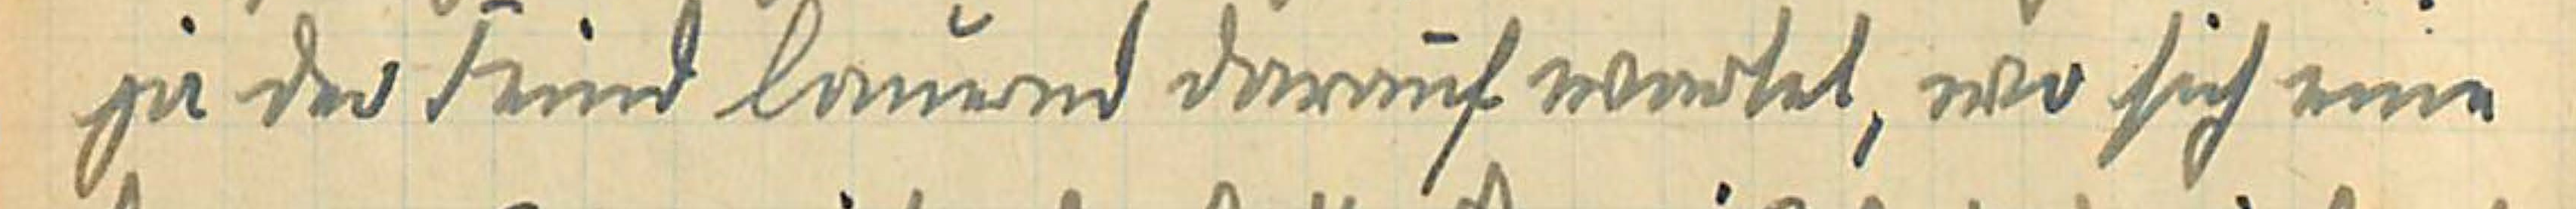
ja der Feind lauernd darauf wartet, wo sich eine
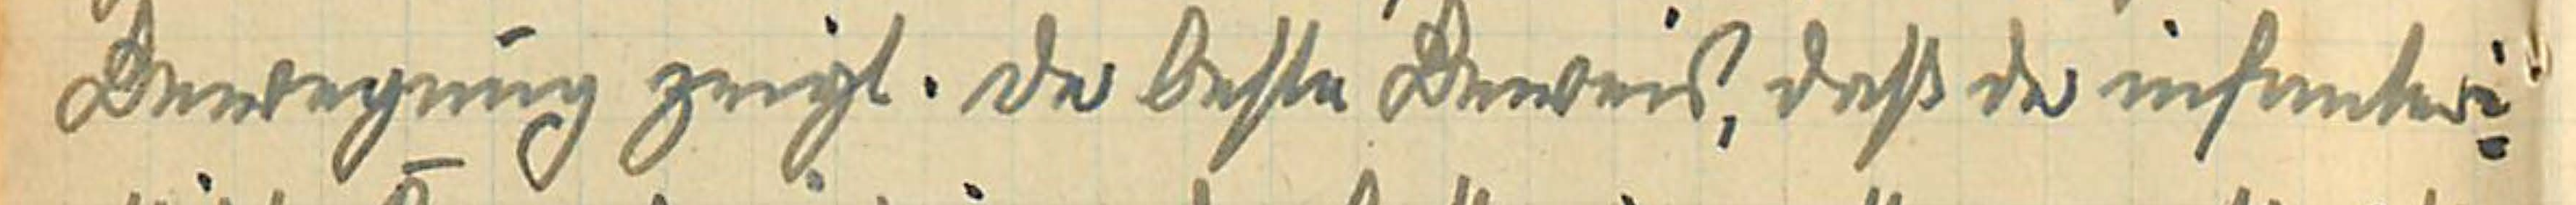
Bewegung zeigt. Der beste Beweis, daß der infanteri-
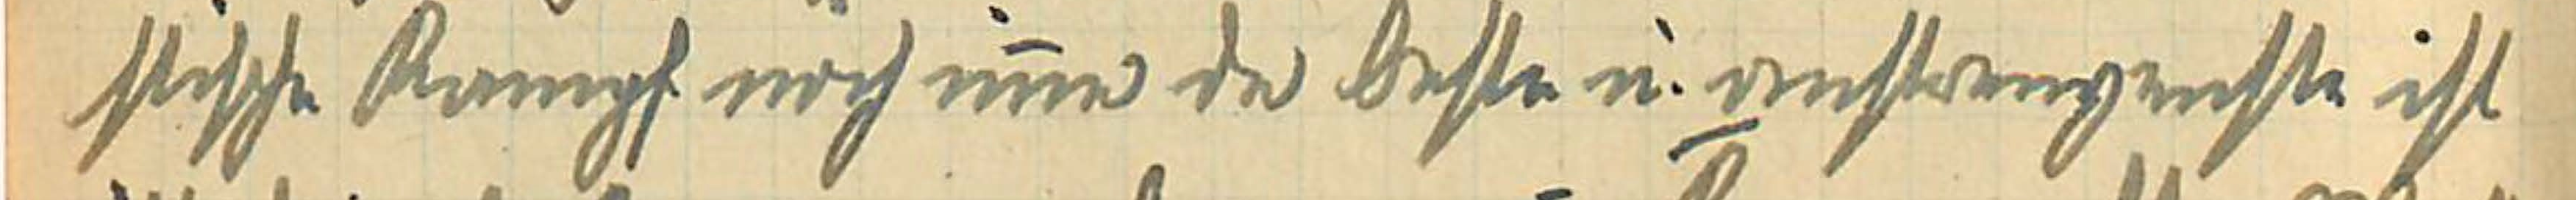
stische Kampf noch immer der beste u. anstrengenste ist
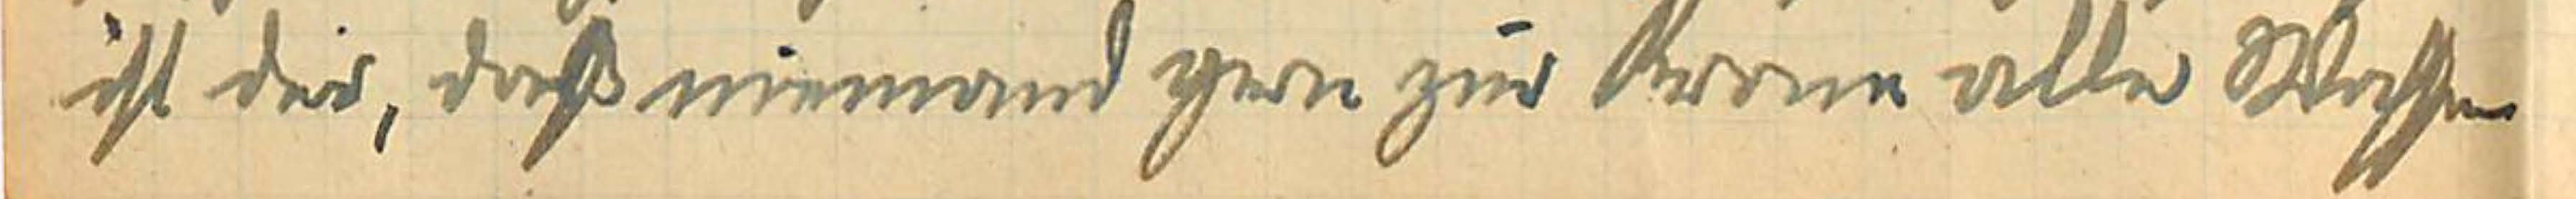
ist der, daß niemand gern zur Krone aller Waffen
